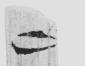又（有）
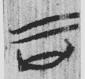司
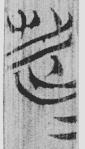老老
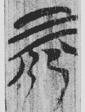而
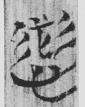{茲才心}（慈）
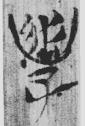{幽子}（幼）
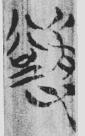{予象又}（豫）
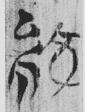絞
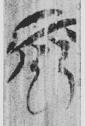而
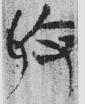收
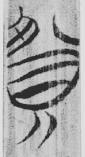貧
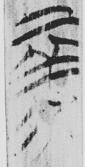彔（祿）
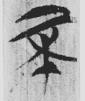不
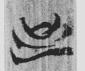足
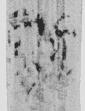則
